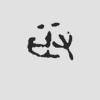取
